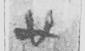廿
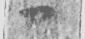四
